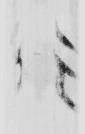行
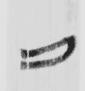㠯（以）
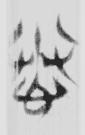𠔉
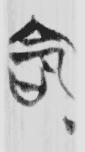命
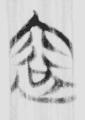裕
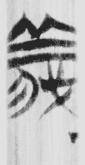義
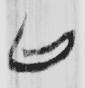㠯（以）
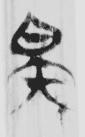{白矢}
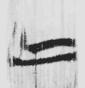亡
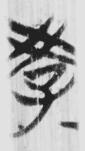𡥈
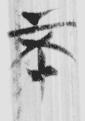不
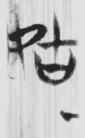姑
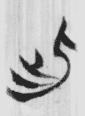此
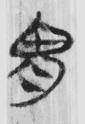胃
